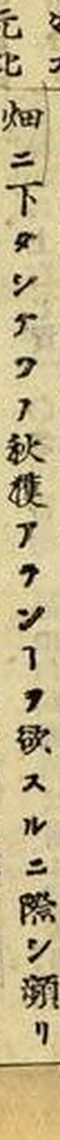畑ニ下タシテソノ秋獲アランヿヲ欲スルニ際シ頻リ
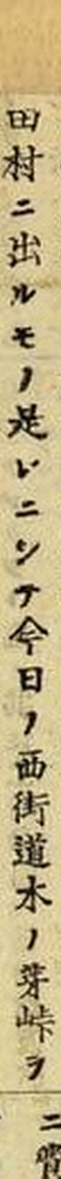田村ニ出ルモノ是レニシテ今日ノ西街道木ノ芽峠ヲ
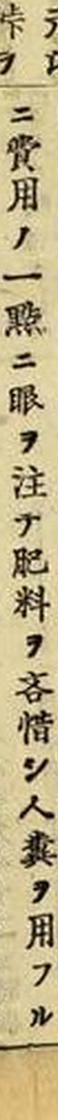ニ費用ノ一點ニ眼ヲ注テ肥料ヲ吝惜シ人糞ヲ用フル
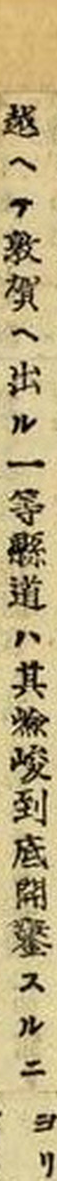越ヘテ敦賀ヘ出ル一等縣道ハ其嶮峻到底開鑿スルニ
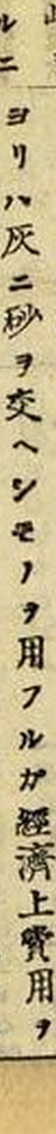ヨリハ灰ニ砂ヲ交ヘシモノヲ用フルガ經濟上費用ヲ
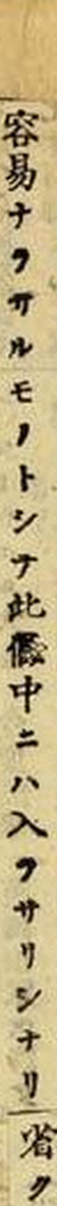容易ナラサルモノトシテ此儀中ニハ入ラサリシナリ
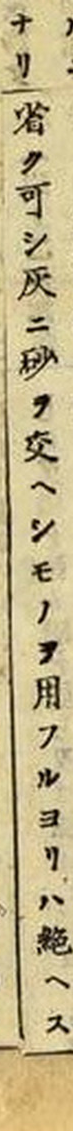省ク可シ灰ニ砂ヲ交ヘシモノヲ用フルヨリハ絶ヘス
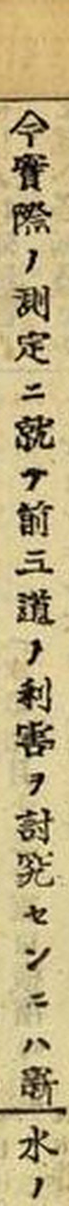今實際ノ測定ニ就テ前三道ノ利害ヲ討究センニハ新
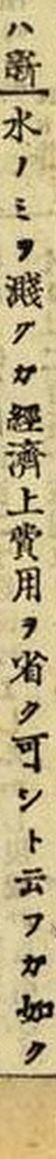水ノミヲ濺グガ經濟上費用ヲ省ク可シト云フガ如ク
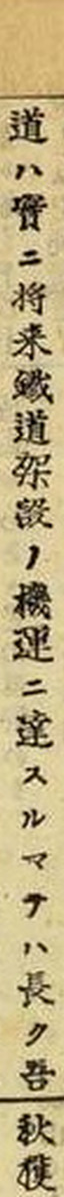道ハ實ニ將来鐡道架設ノ気運ニ達スルマテハ長ク吾
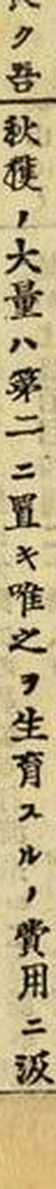秋獲ノ大量ハ第二ニ置キ唯之ヲ生育スルノ費用ニ汲
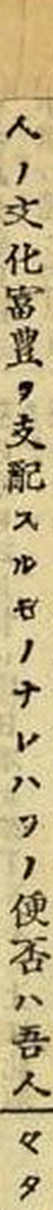人ノ文化富豊ヲ支配スルモノナレハソノ便否ハ吾人
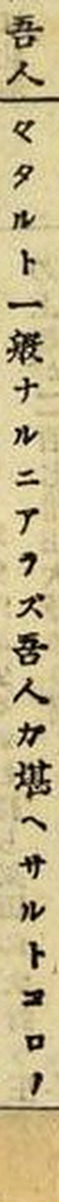々タルト一般ナルニアラズ吾人ガ堪ヘサルトコロノ
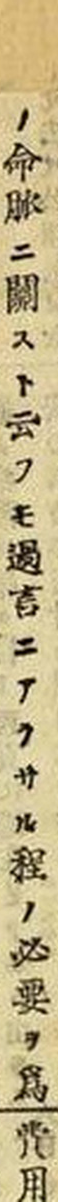ノ命脈ニ關スト云フモ過言ニアラサル程ノ必要ヲ爲
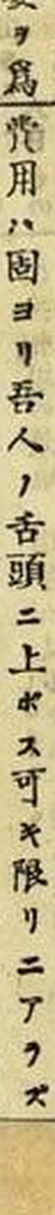費用ハ固ヨリ吾人ノ舌頭ニ上ボス可キ限リニアラズ
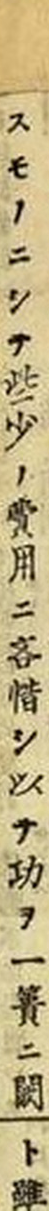スモノニシテ些少ノ費用ニ吝惜シ以テ功ヲ一責ニ闕
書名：温古集 五巻
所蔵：福井県文書館 Fukui Prefectural Archives
